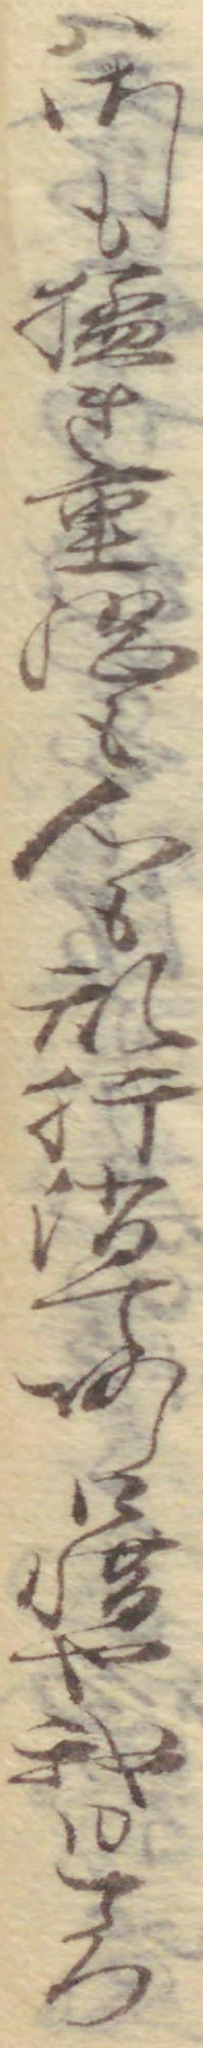はさしも猛き重綱も心も乱肝消てあゝ口惜や我日ころ
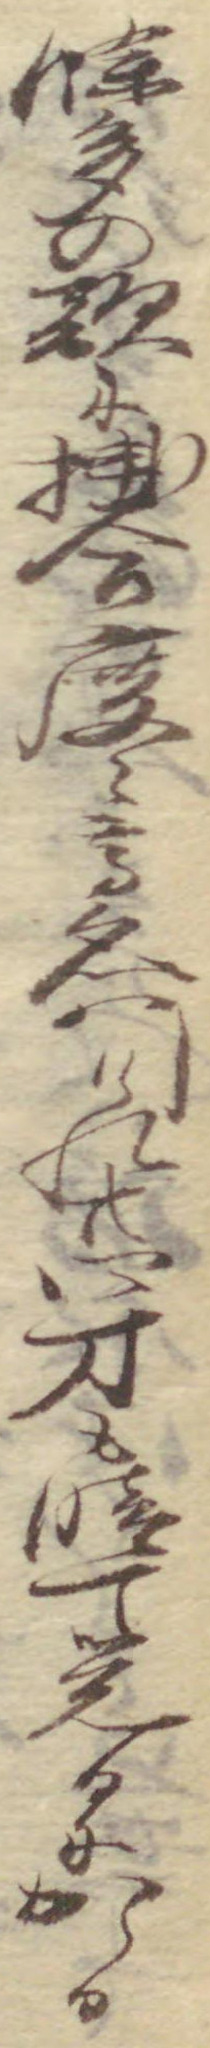余多の敵に掛合度々高名はしけれ共四方も晴て覚るにかゝる
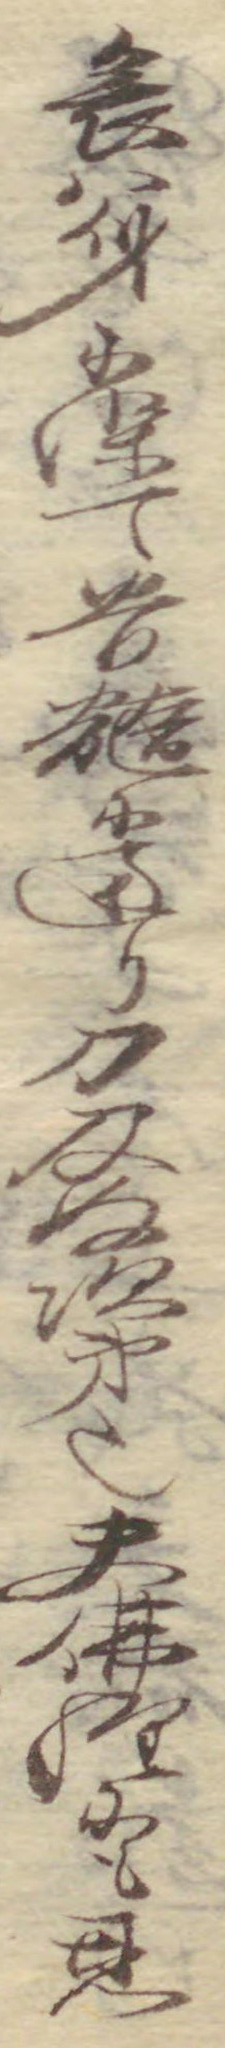哀は身に染て骨髄に通り刀及ぬ次第也夫仏経にも恩
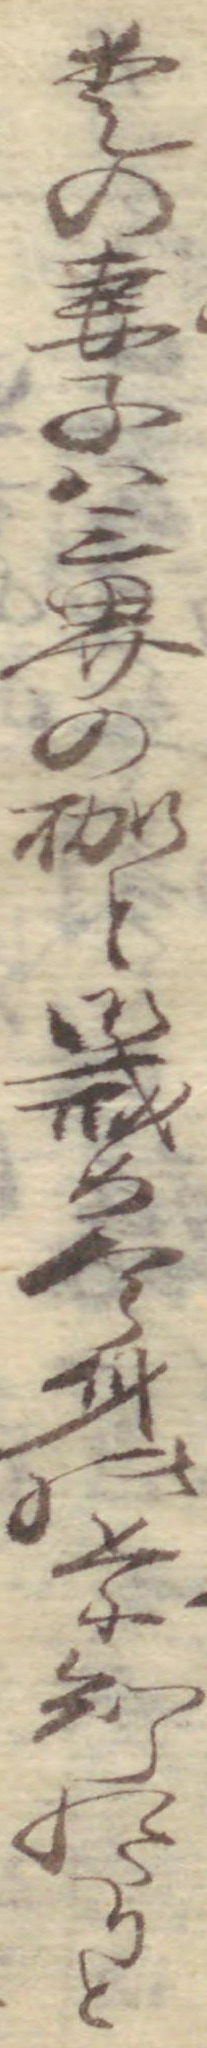愛の妻子は三界の枷と御戒め今身の上に知られたりと
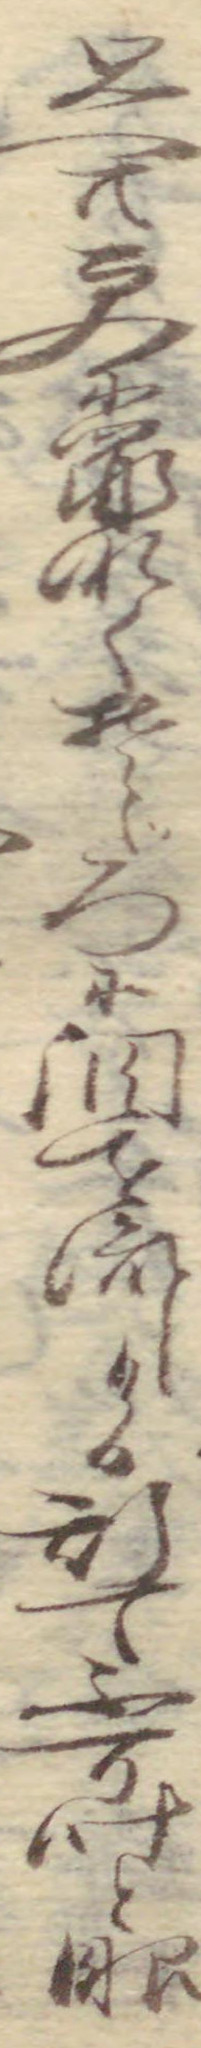思へ共更に罪なくそゞろに泪を流しける斯て不可叶と眼
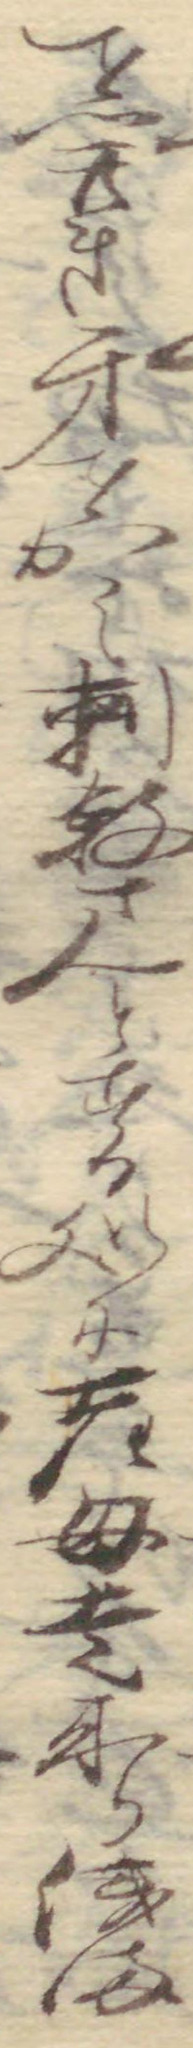を開き牙をかくし刺殺さんとする処に老母走来り浅ま
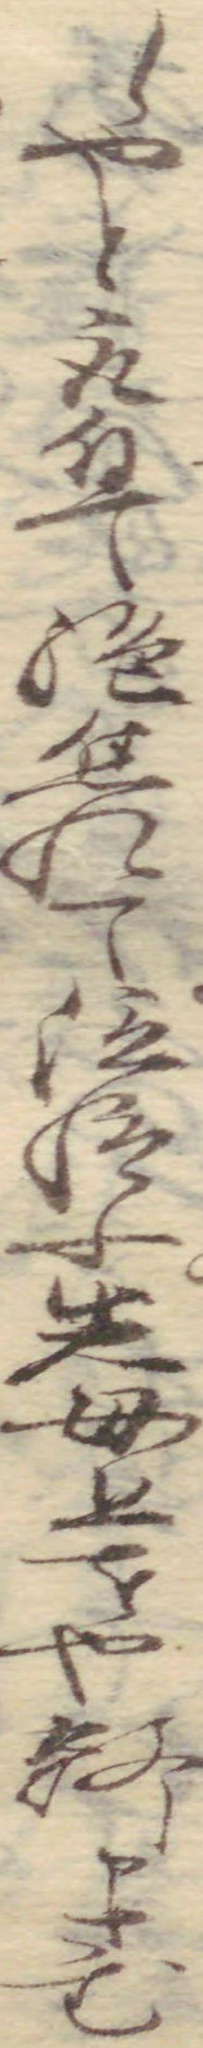しやと取付て絶焦れて泣給ふ先母上をや殺し申さむ
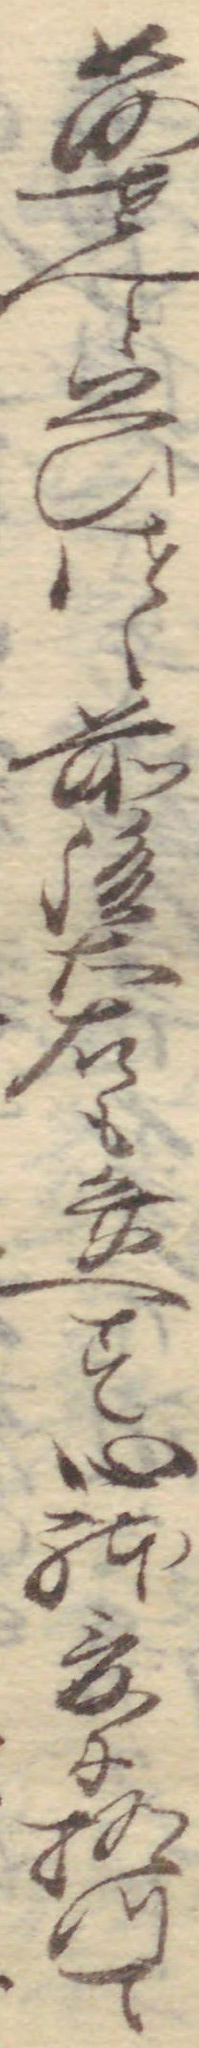如何せんと思ひつゝ前後左右も弁へす心体爰に極つて
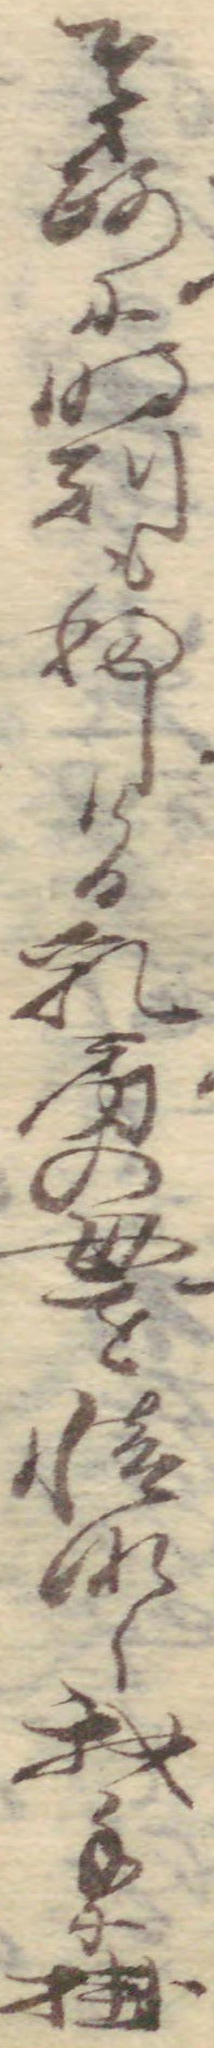そゝろに時刻も移しける乳房の母を情なく我手に掛
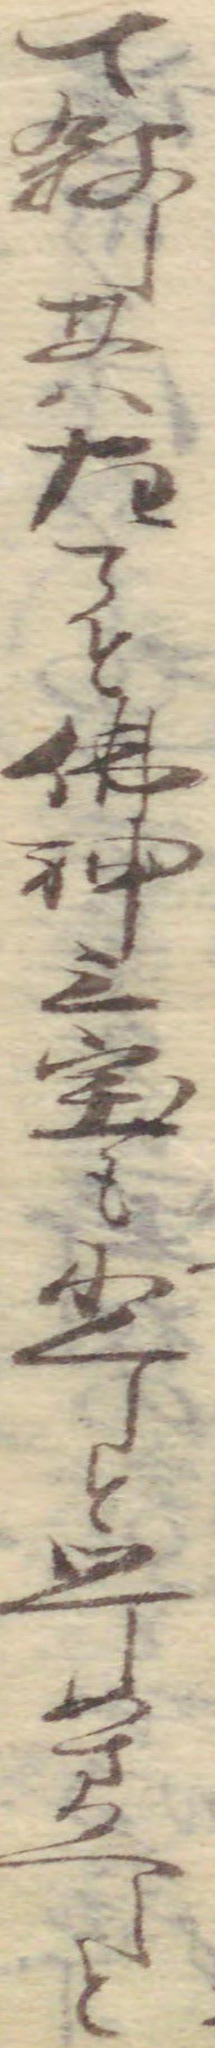て殺しなは左こそ仏神三宝もにくしと思しめさるへしと
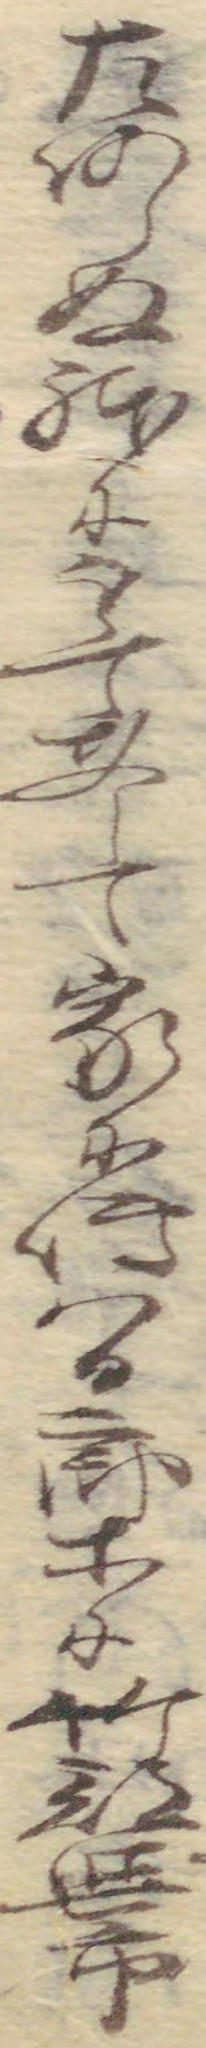左あらぬ体にもてなして家に伝はる郎等に竹部与市
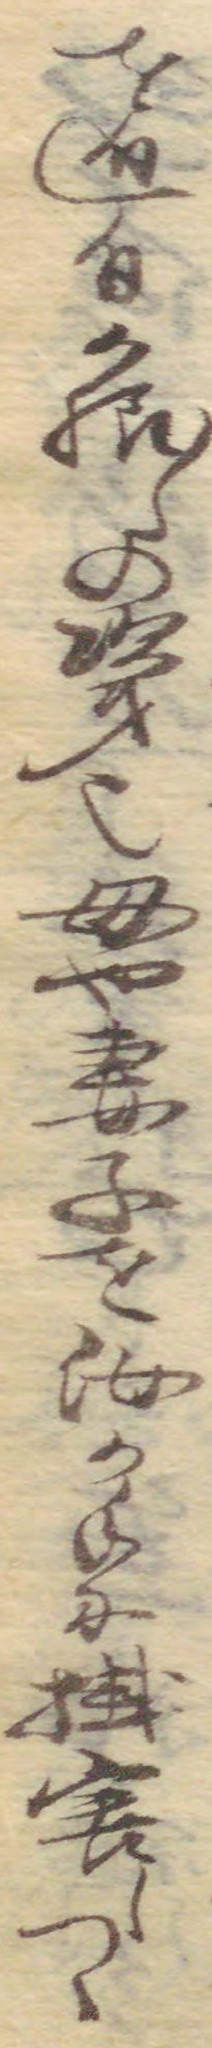を近付か様〳〵の次第也母や妻子を汝か手に掛害しつゝ

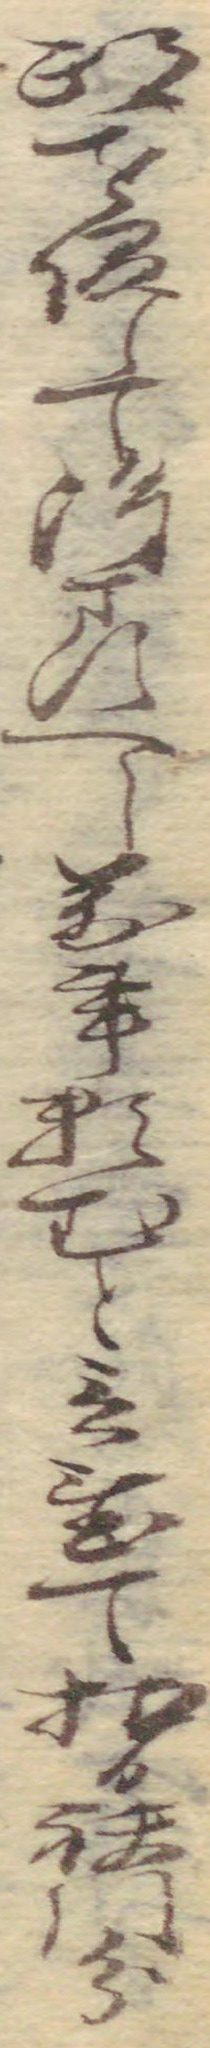跡を隠して得さすへし萬事頼むと言置て把る袂引分
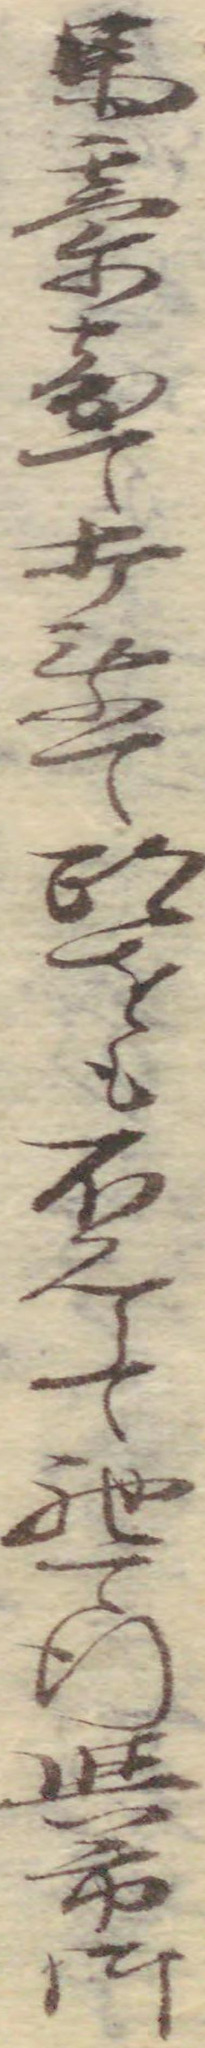馬牽寄て打乗て跡をも不見して馳て行与市御
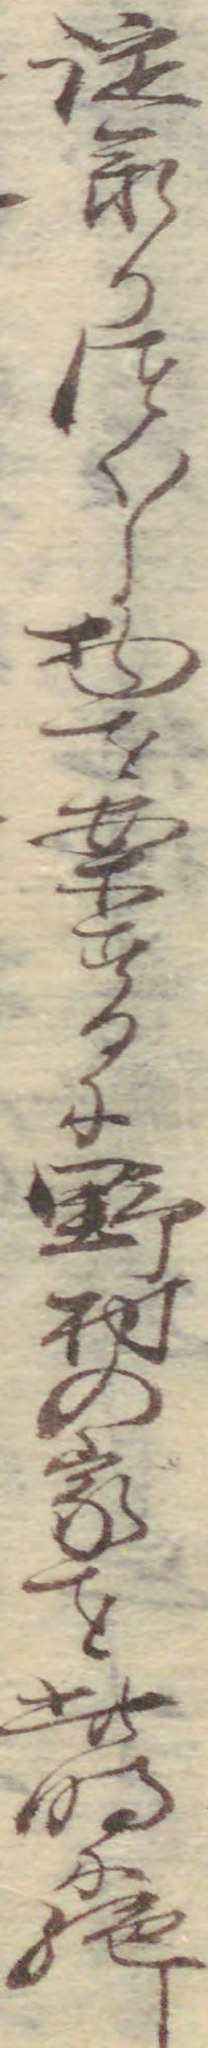諚承りつく〳〵物を案するに野村の家を此時に絶し
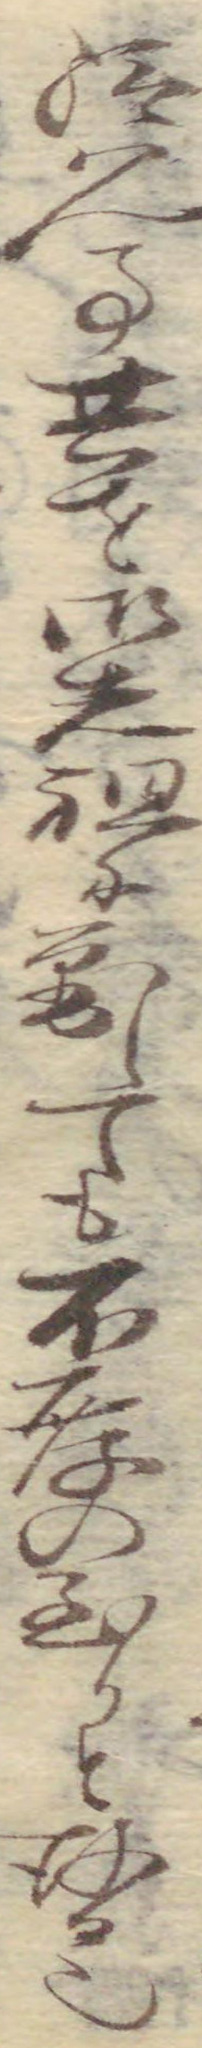給はん事共を御先祖に対しても不孝の至りと存る也
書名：鶯宿雑記. 巻199-200
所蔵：国立国会図書館 National Diet Library, JAPAN
